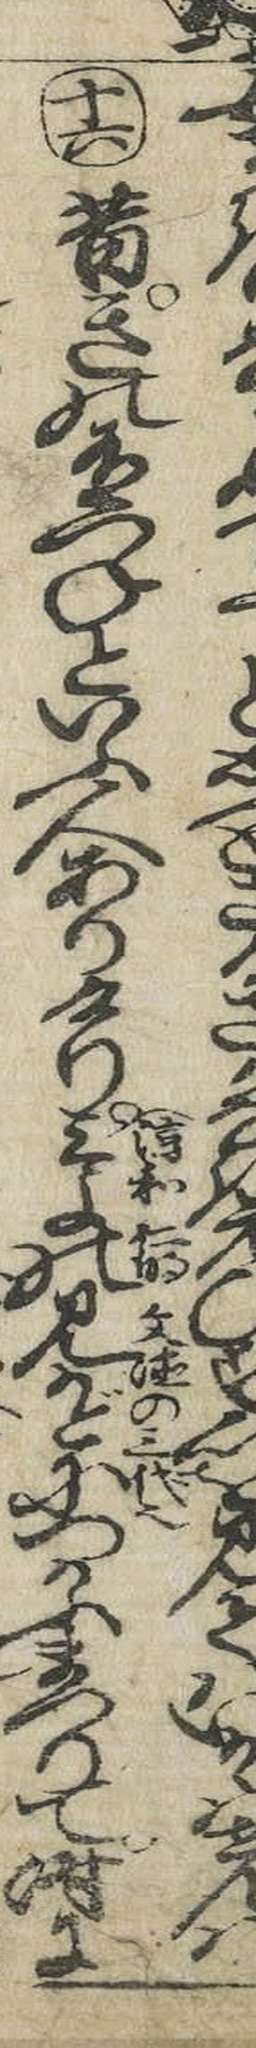(十六)昔。きの有つねといふ人ありけり。みよのみかどにつかふまつりて。時に
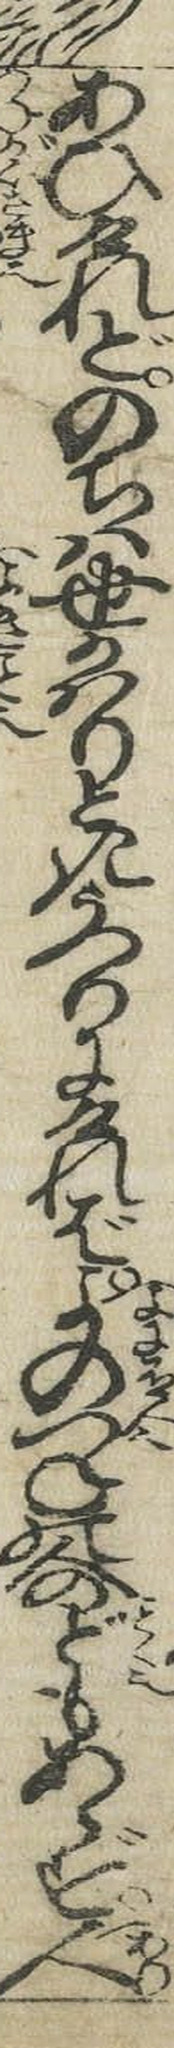あひけれど。のちは世かはりときうつりにければ。よのつねの人のごともあらず。人
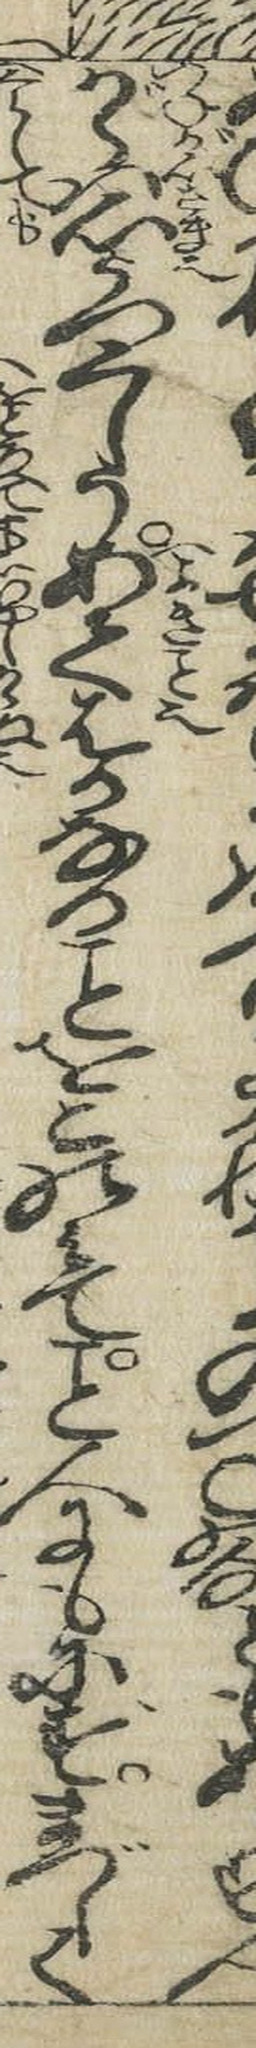がらは心うつくしう。あてはかなることをこのみて。こと人にもにず。まづしく
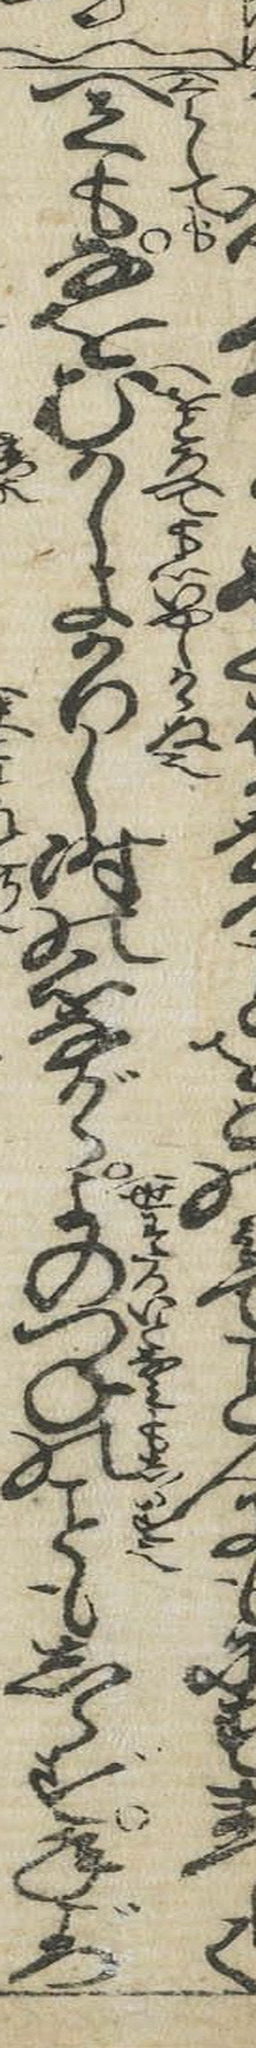へても。なをむかしよかりし時の心ながら。よのつねのこともしらず。年ごろ
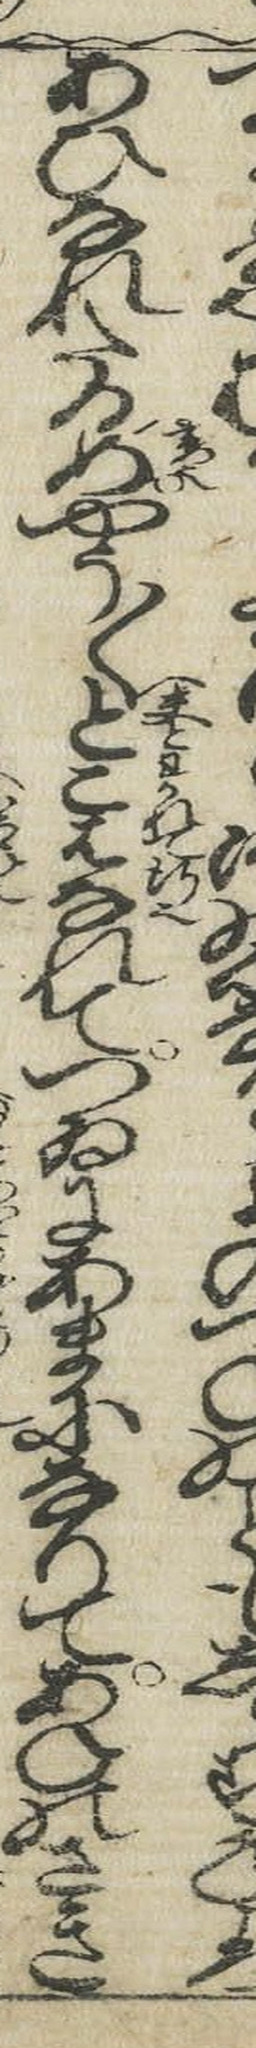あひなれたるめ。やう〳〵とこはなれて。つゐにあまになりて。あねのさき
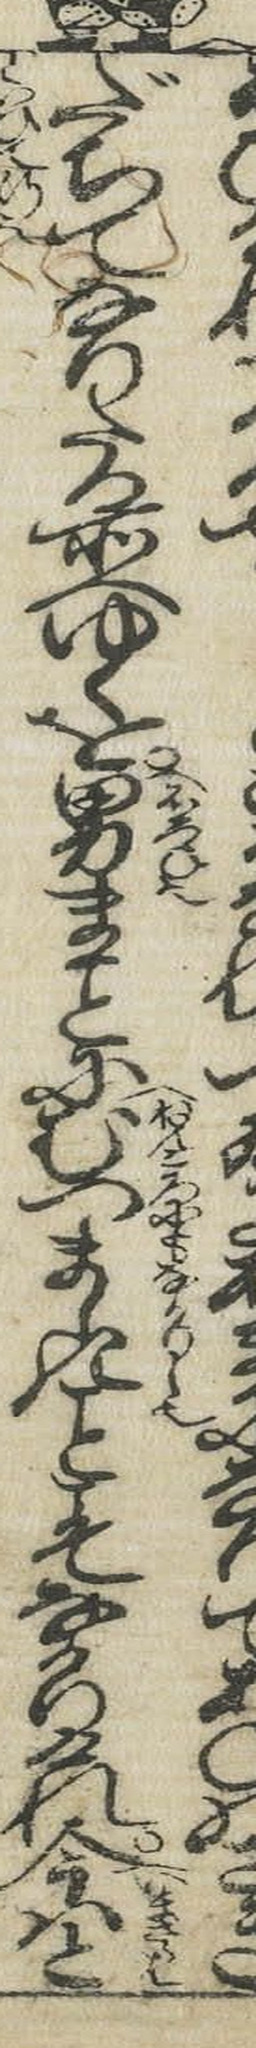だちてなりたる所へゆくを。男まことにむつましきことこそなかりけれ。今はと
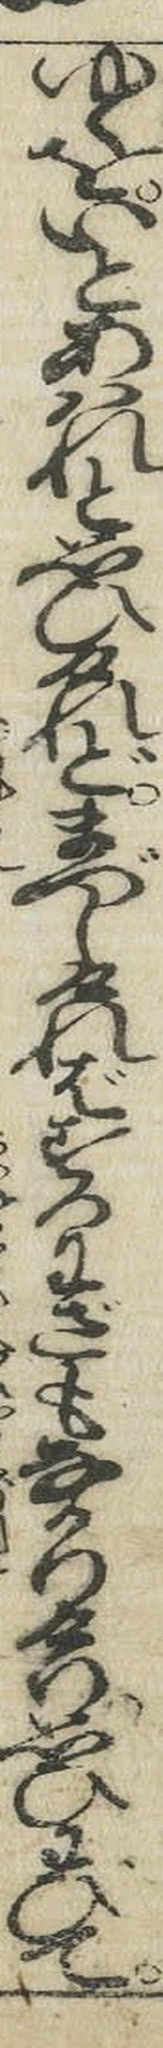ゆくを。いとあはれと思ひけれど。まづしければするわざもなかりけり。思ひわびて。
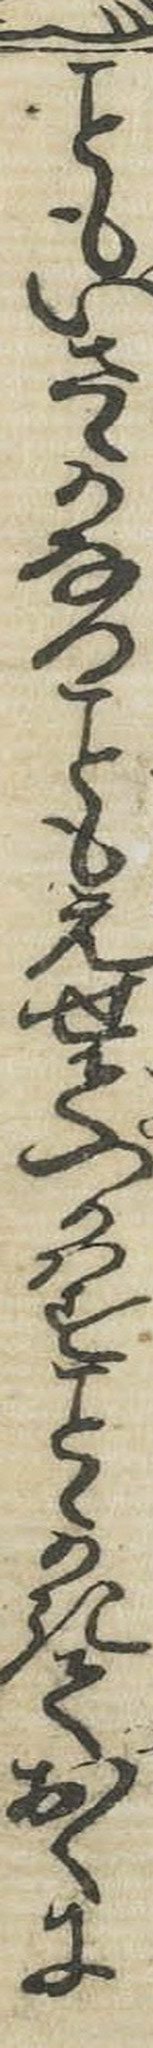こともいさゝかなることもえせで。つかはすことくかきて。おくに
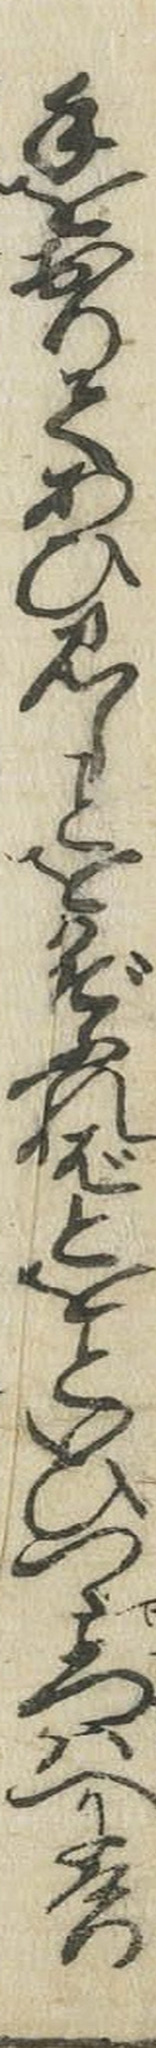手をおりてあひ見しことをかぞふればとをといひつゝよつはへにけり
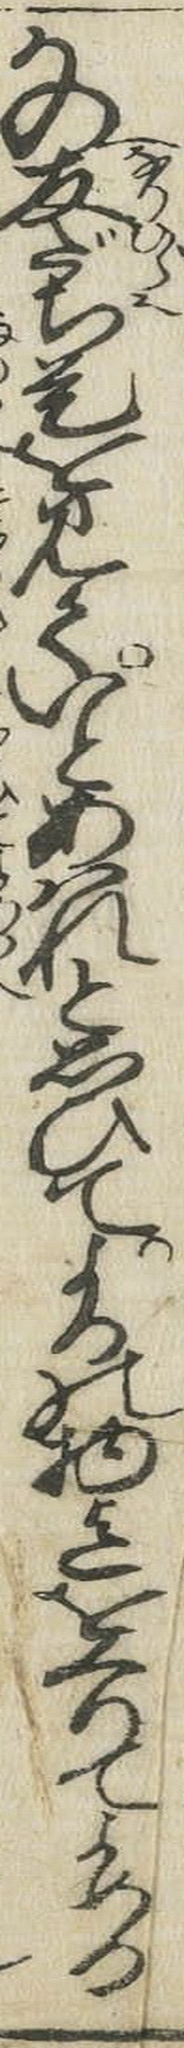かの友だち是を見て。いとあはれと思ひて。よるの物迄をくりてよめる
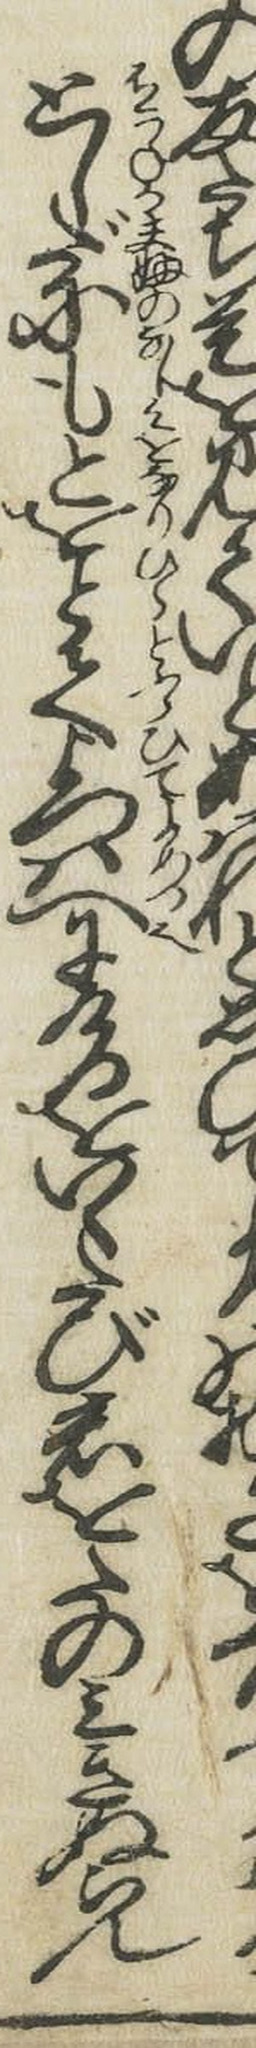としだにもとをとてよつはへにけるをいくたび君をたのみきぬらん
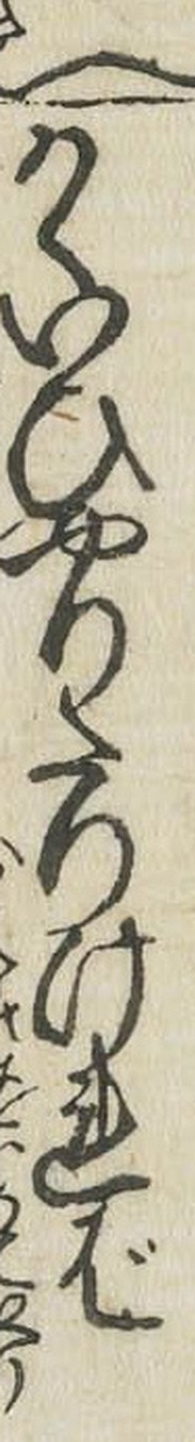かくいひやりたりければ
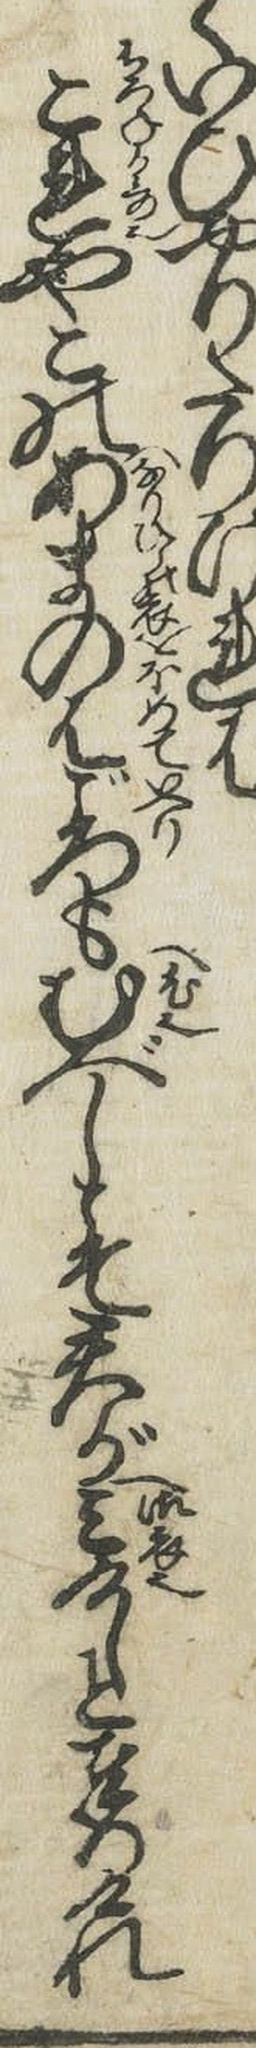これやこのあまのはごろもむべしこそ君がみけしと奉りけれ
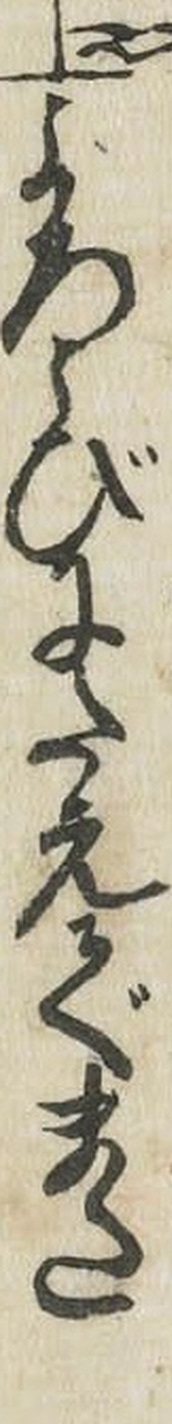よろこびにたえでまた
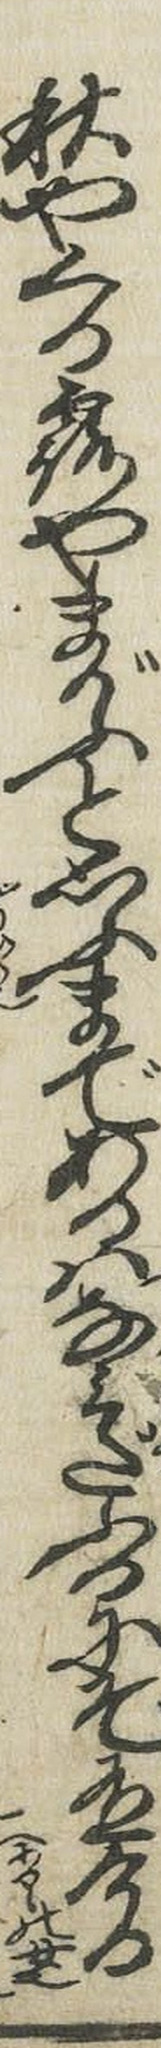秋やくる露やまがふと思ふまであるはなみだふるにぞ有ける
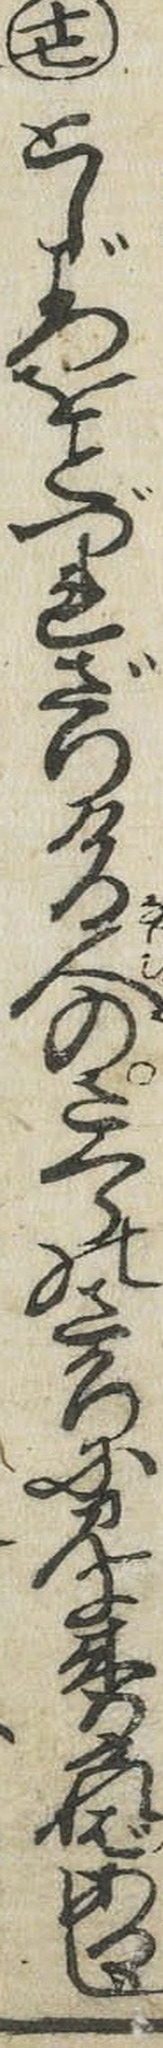(十七)としごろをとづれざりける人の。さくらのさかりに見に来りければあるじ
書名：新板絵入伊勢物語 : かうしやく付 2巻 上
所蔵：東京学芸大学教育コンテンツアーカイブ
